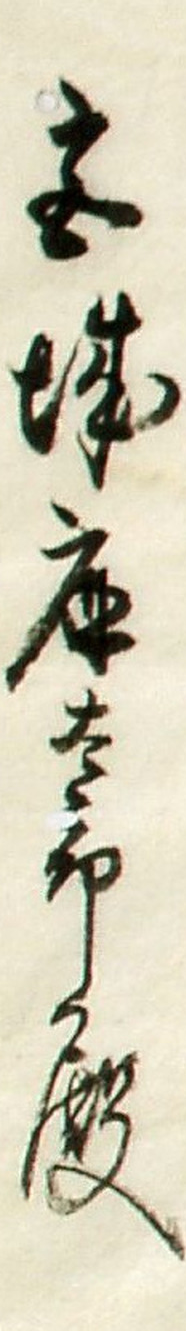宮城麻太郎殿

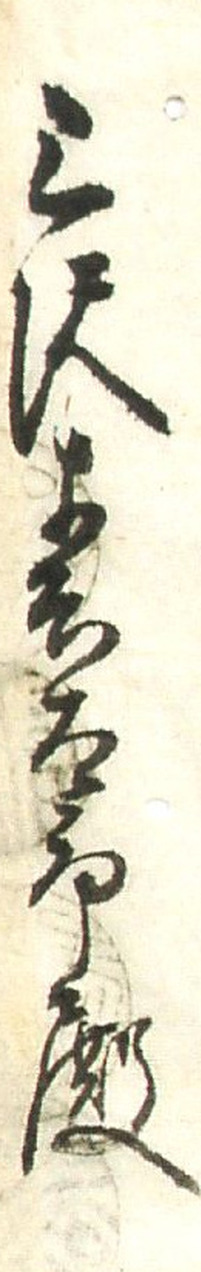三澤春太郎殿
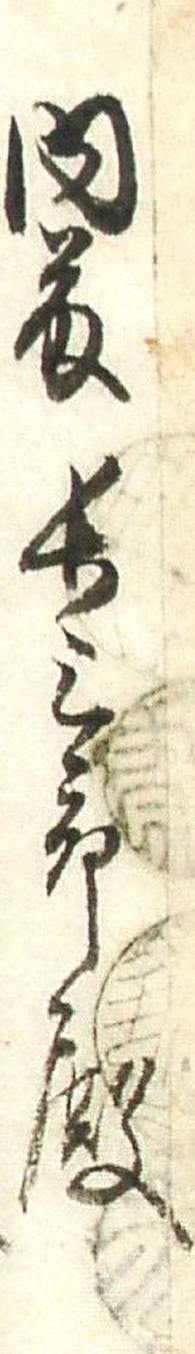内藤長三郎殿
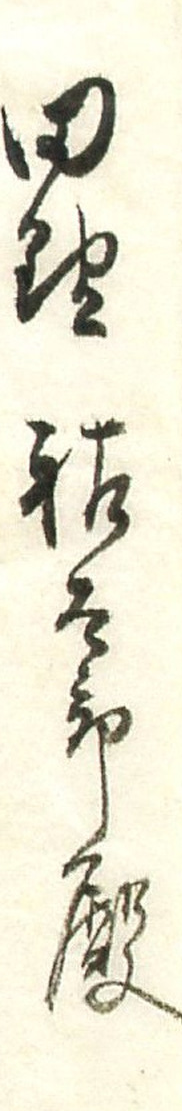田野祐太郎殿
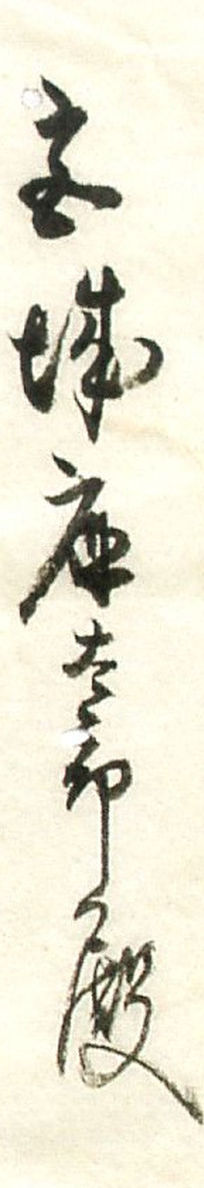宮城麻太郎殿
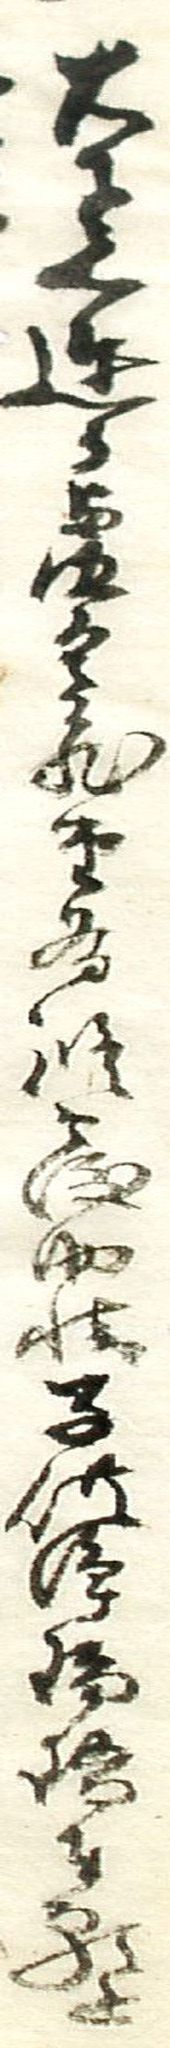右者右者先達而虚空蔵堂為修覆助情子供浄瑠璃奉願上
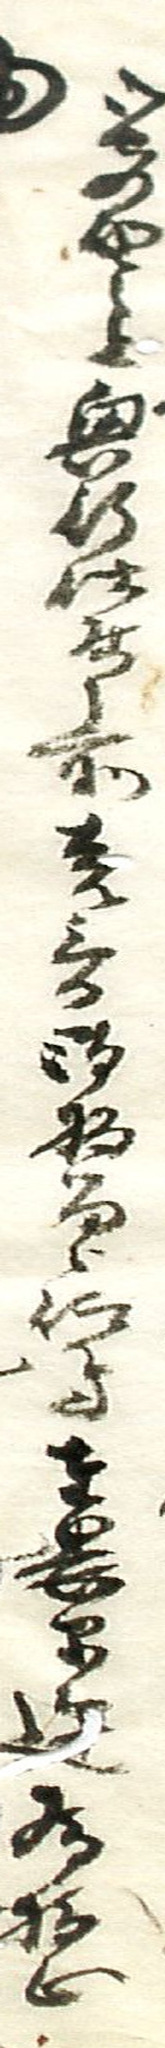御聞届之上興行仕居申所去ル三日御指留被仰付奉畏早速為指止
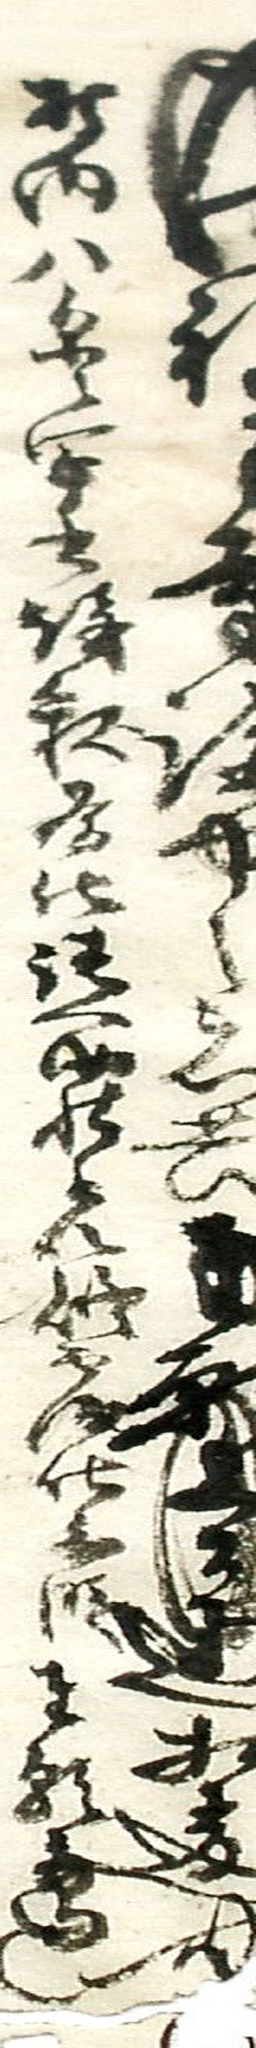「村内八兵衛ニ軍書講釈為仕諸人助情ヲ以て修覆仕度段奉願之通」
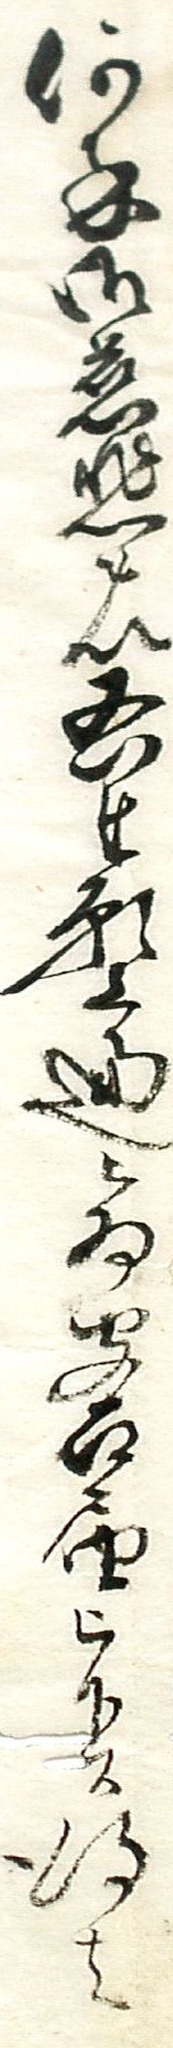何卒御慈悲ヲ以右奉願上通被為聞届被下候得者
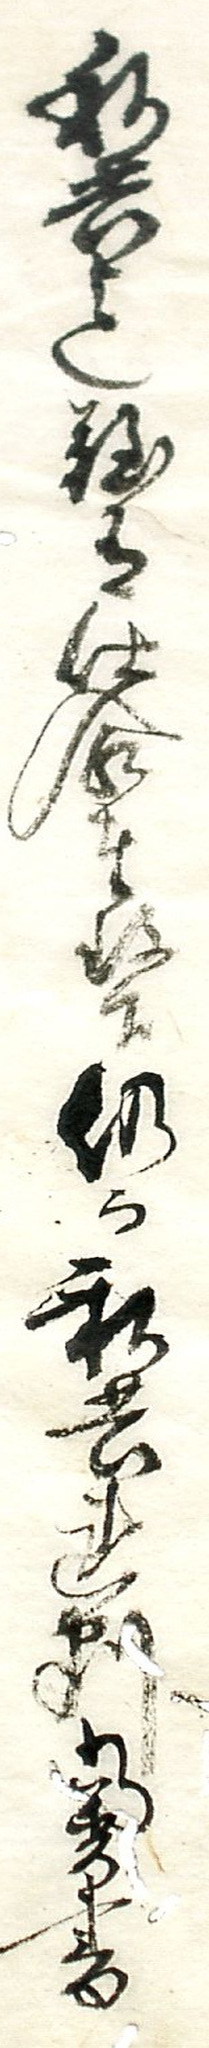私共迄難有仕合奉存候仍而私共連判奥書
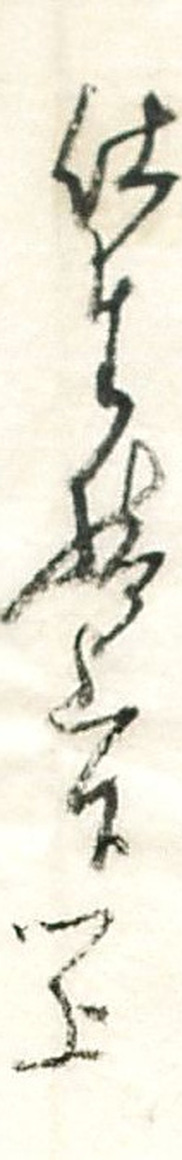仕奉指上候以上
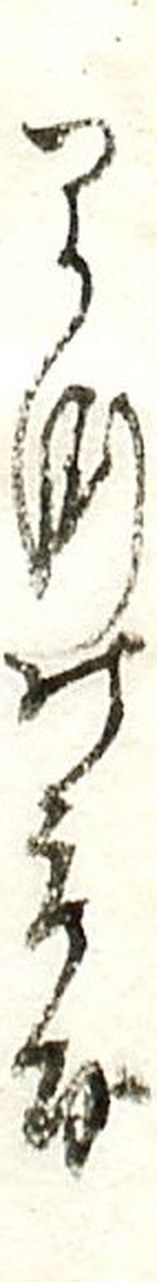早渕村庄屋
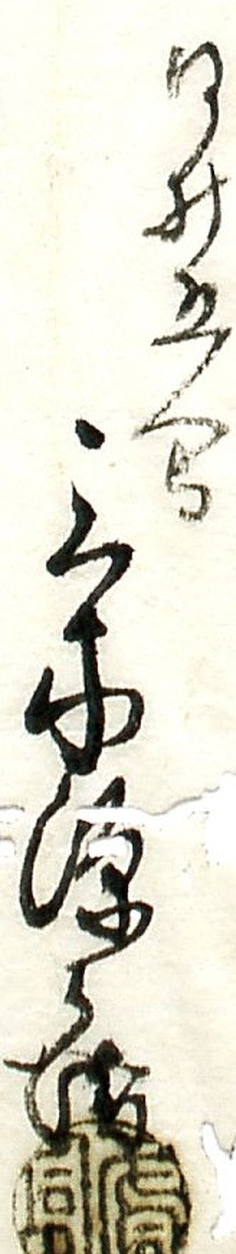三木源兵衛
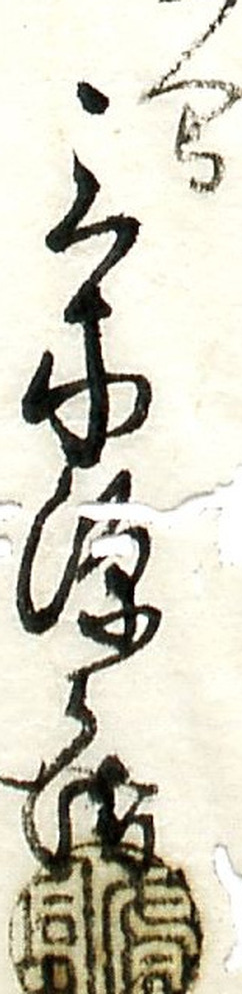三木源兵衛
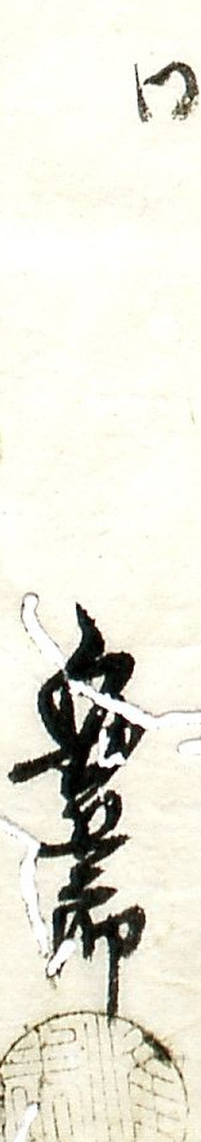同安五郎
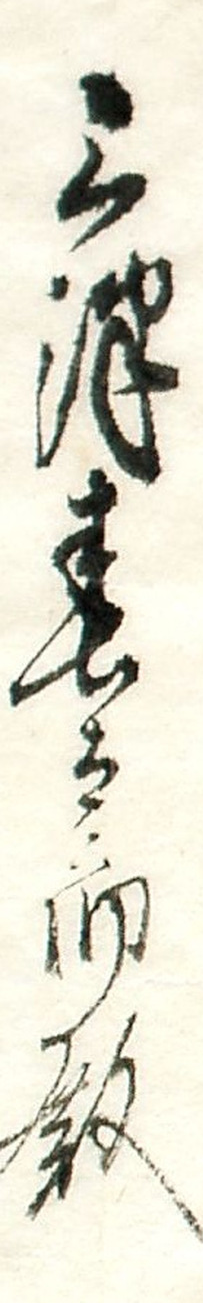三澤春太郎殿
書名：(早渕村福満寺子ども浄瑠璃願紙面）他
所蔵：鳴門教育大学 Naruto University of Education
